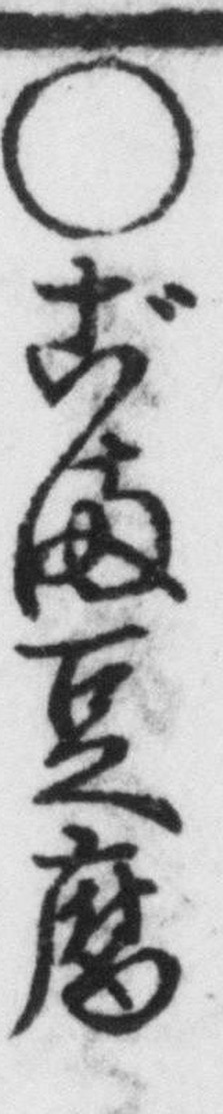〇ごま豆腐
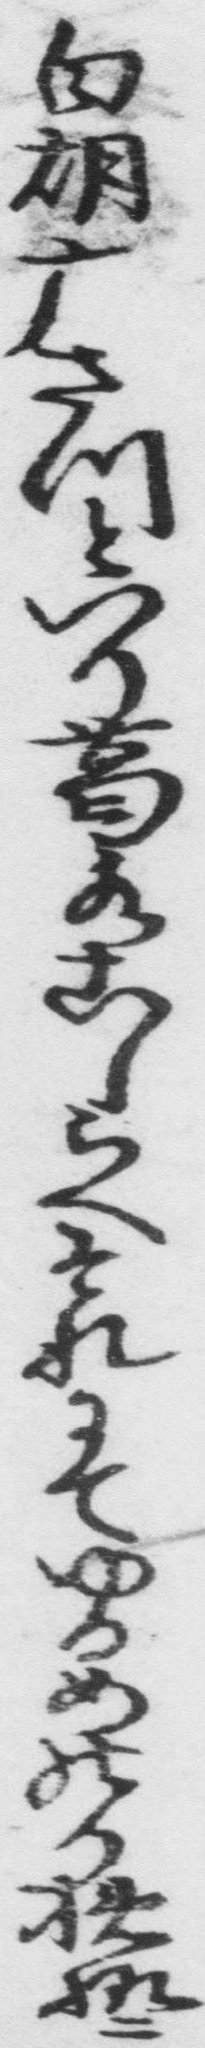白胡麻さつといり葛水こしらへそれにてゆるめのり挽様に
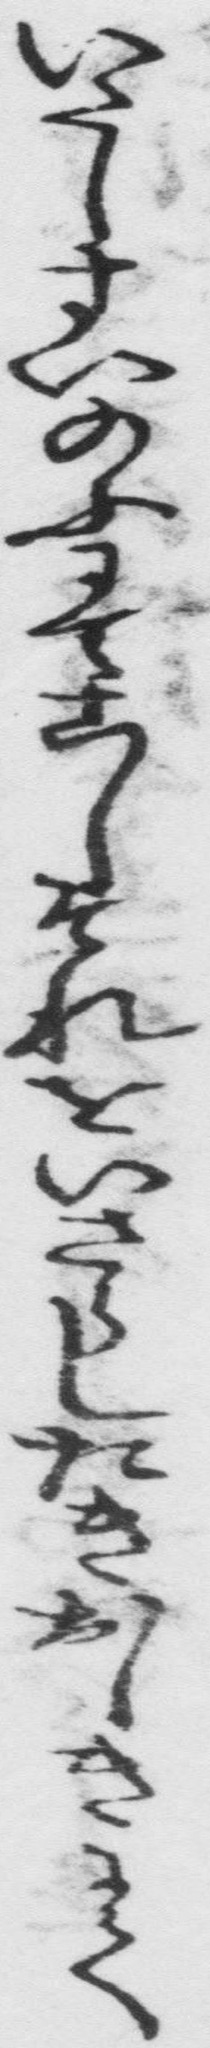いたしすいのふにてこしそれをいさらしたきおしきにて

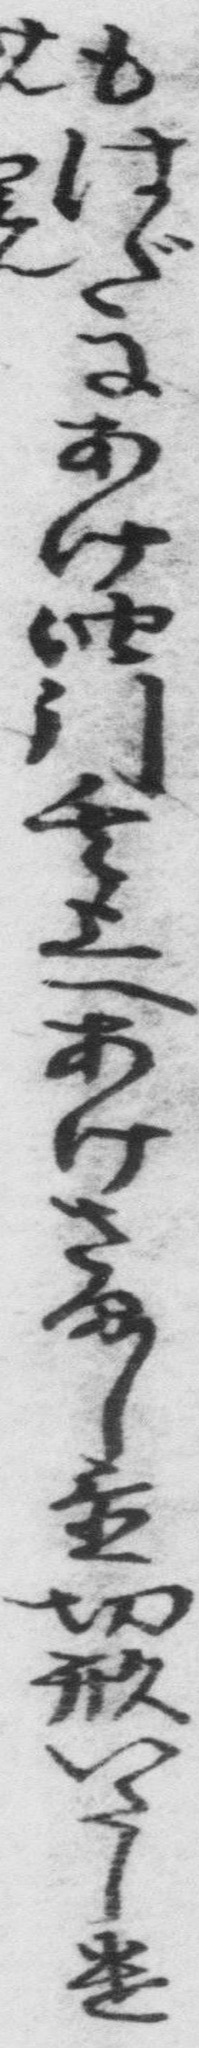もはだにあけ油引其上へあけさまし置切形いたし遣
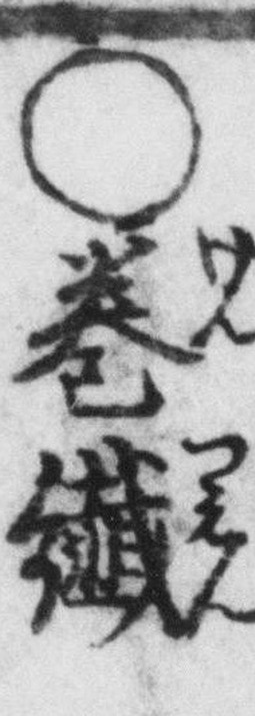○巻鐡
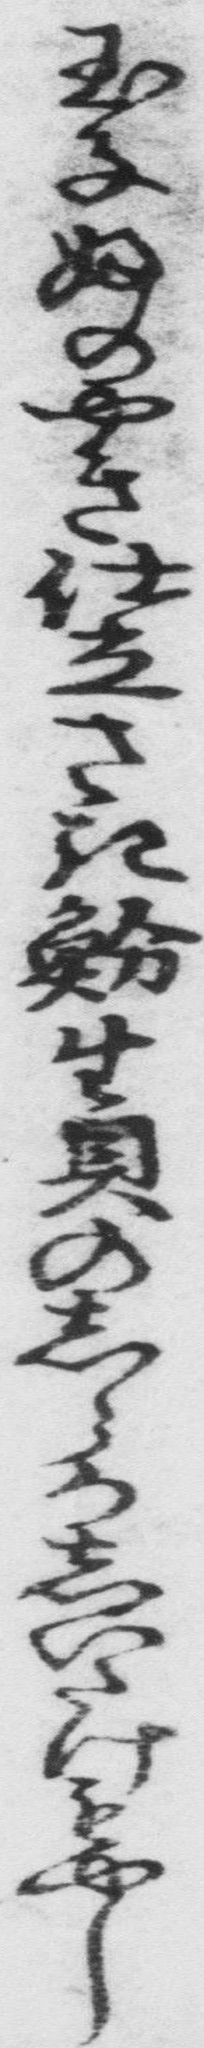玉子ふのやき仕立さき魵生貝のしらかしいたけもやし
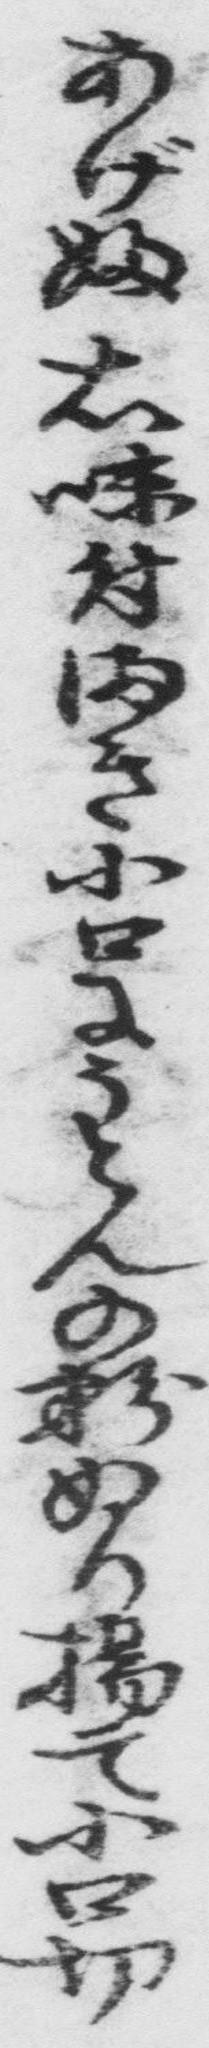あげふ右味付まき小口にうとんの粉ぬり揚て小口切
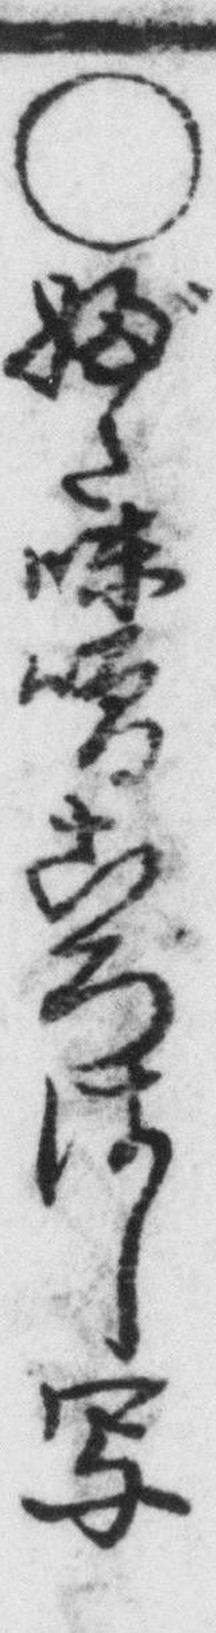○ぶた味噌ころはし写
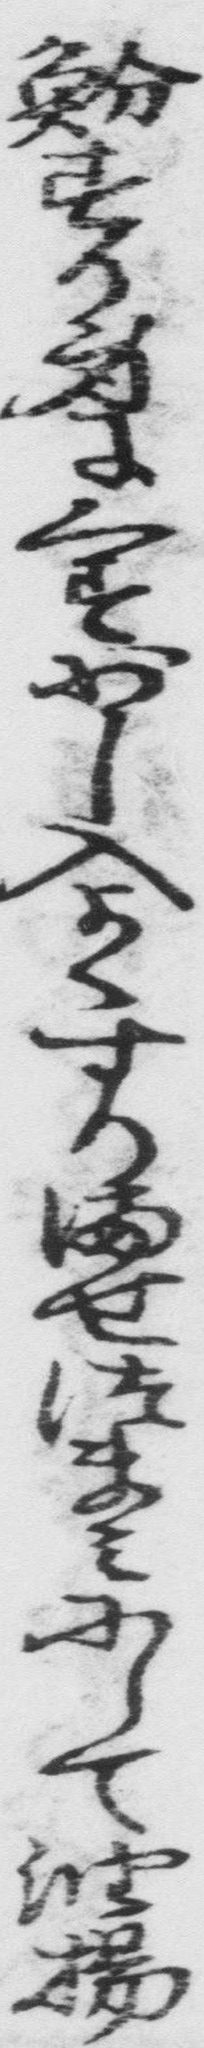魵をすり身にくす少入よくすりませつまみにして油揚
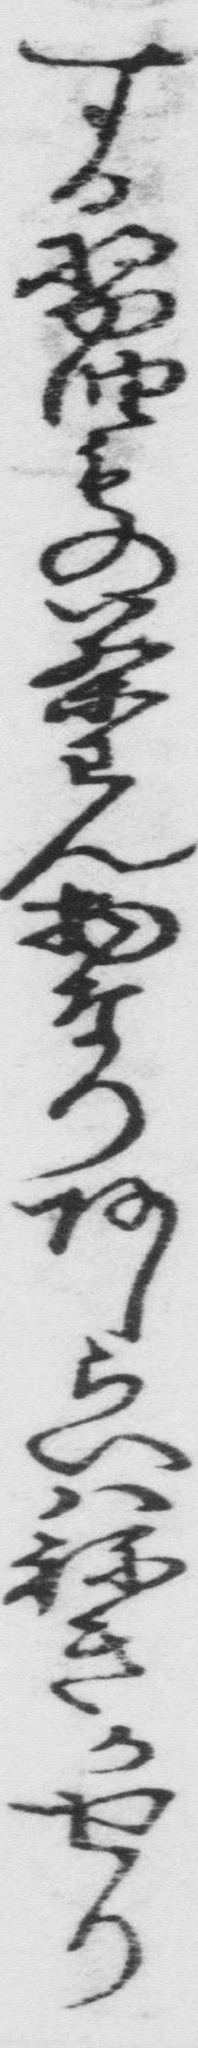する醤油もの茶わん物なりあしらいはねきかせり
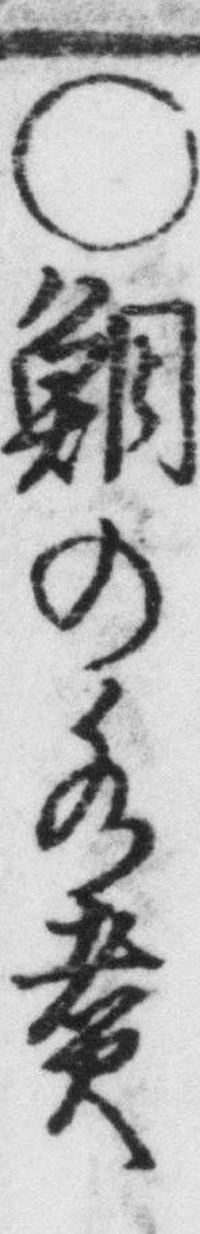○鯛の水煮
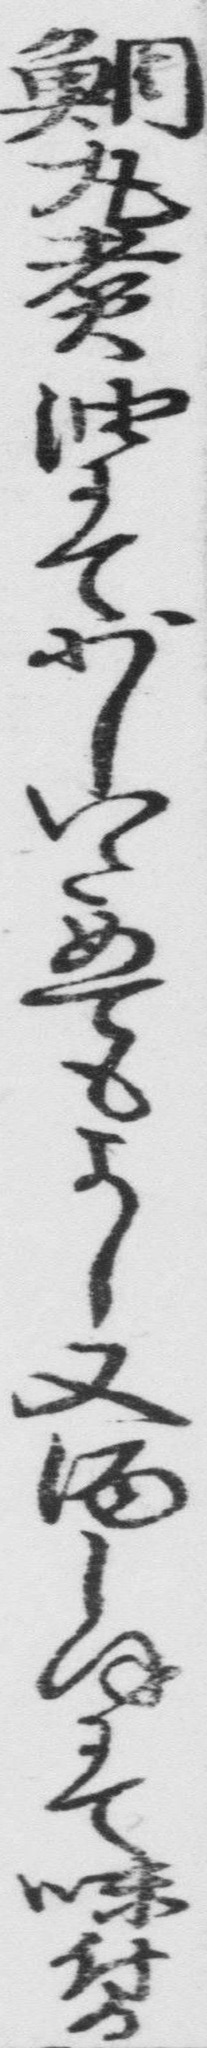鯛丸煮油にて少しいためてもよし又酒しほにて味付る
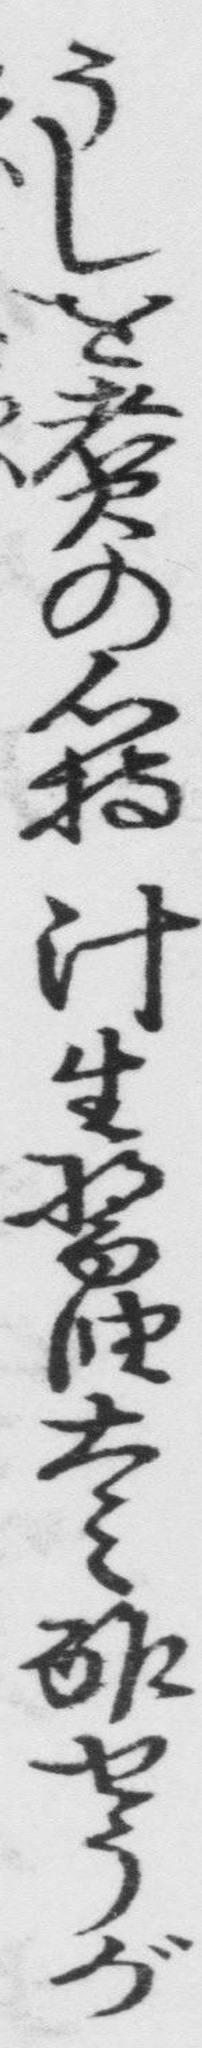うしを煮の心持汁生醤油太々酢せうが
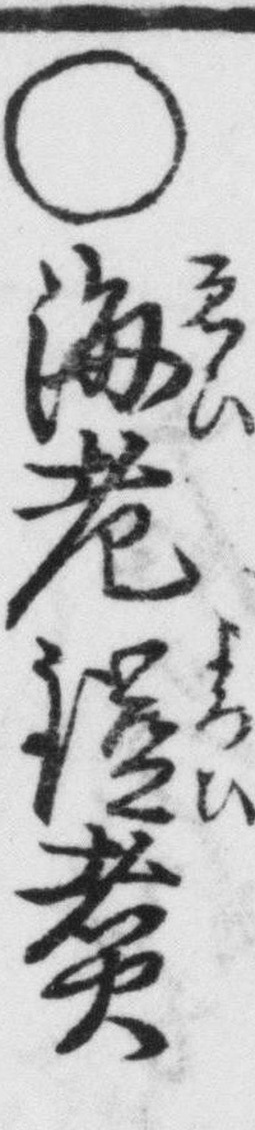○海老鎧煮
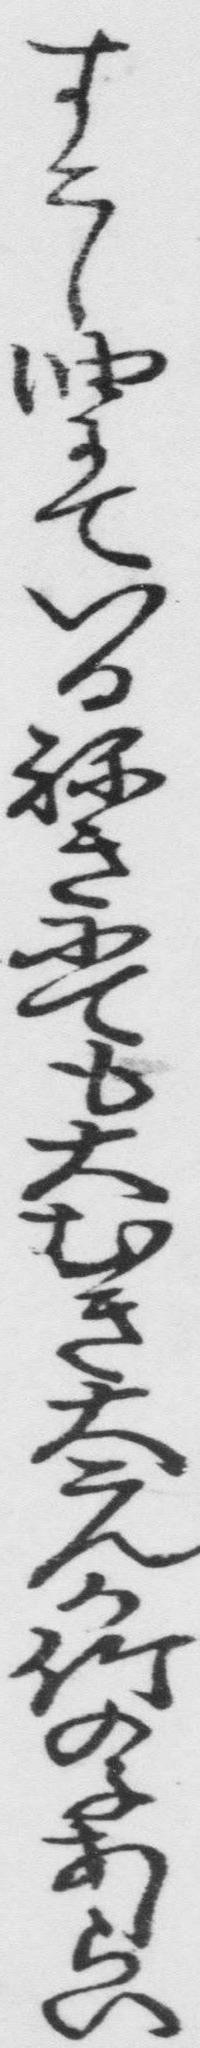すこし油にているねきにても大むき大こんか竹の子あしらい
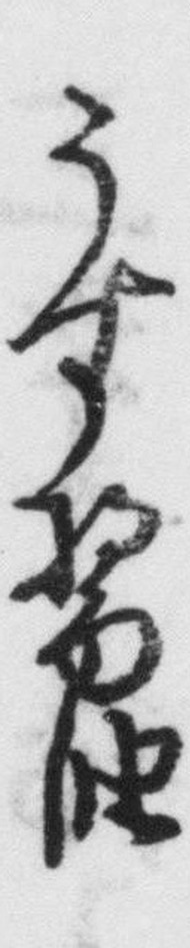うす醤油
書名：卓子料理仕様
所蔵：大阪府立大学学術情報センター 国文学研究資料館
